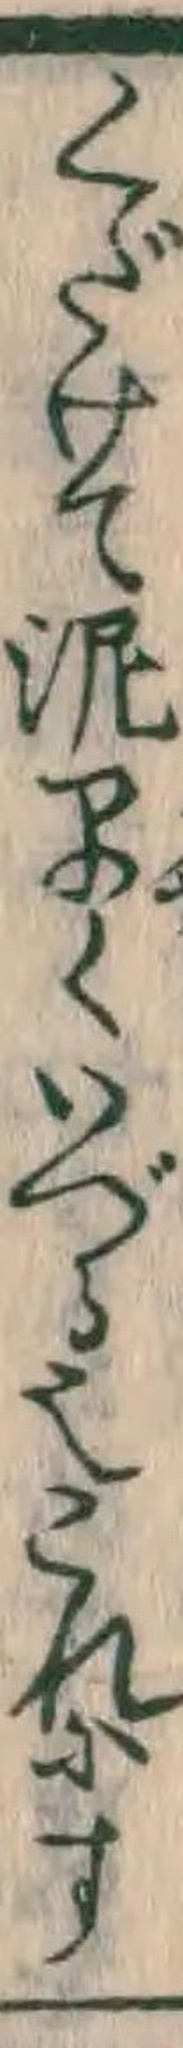くだけて泥早くいづる也これにす
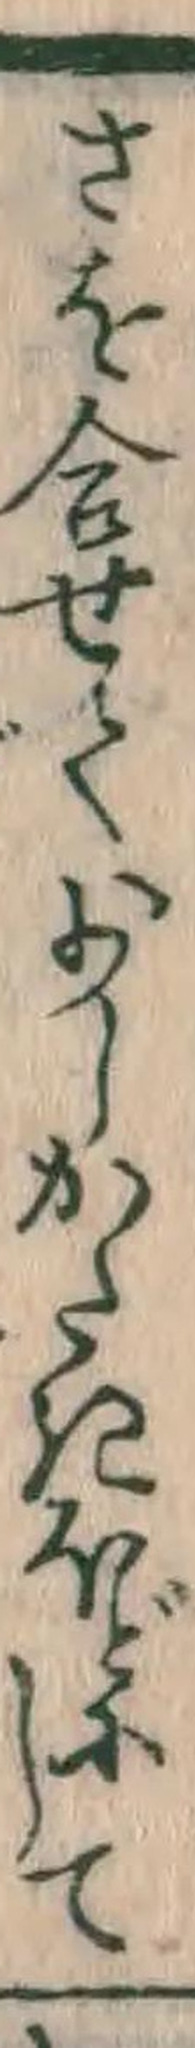さを合せて少しかたきほどにして
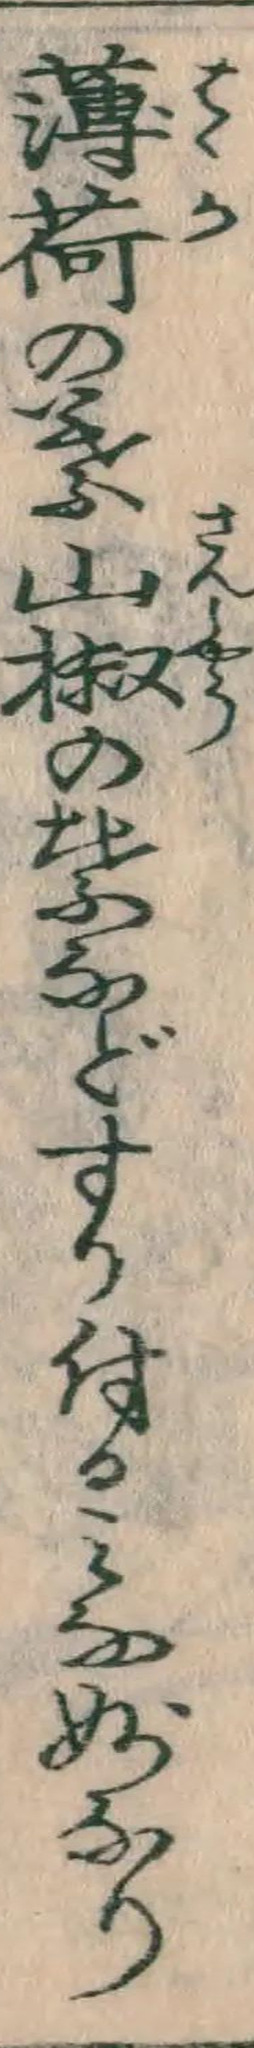薄荷の葉山椒の葉などすり付るみな妙なり
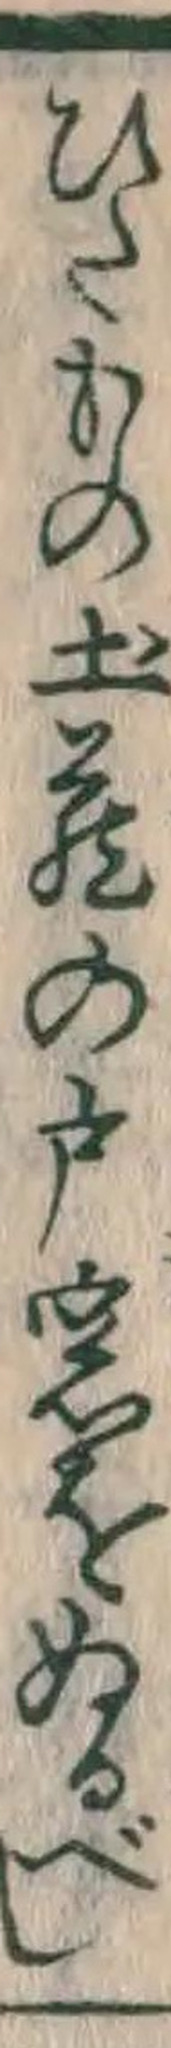ひたもの土蔵の戸窓をぬるべし
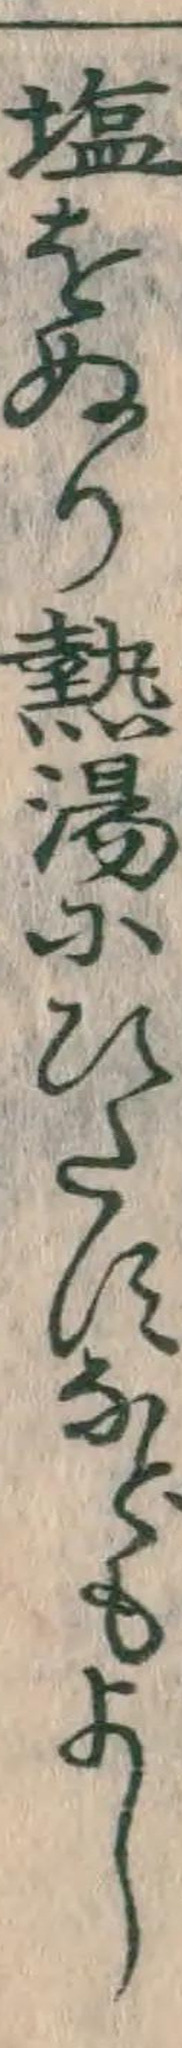塩をぬり熱湯にひたすなどもよし
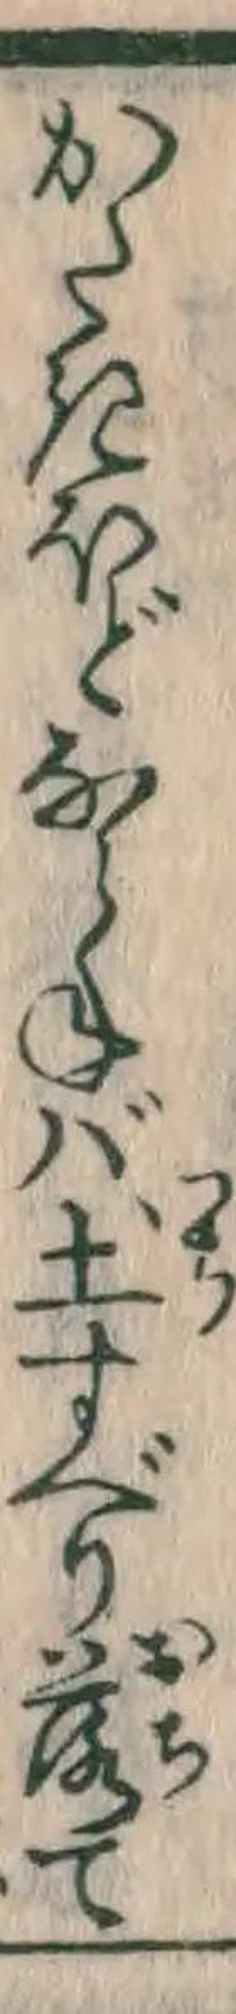かたきほどならねば土すべり落て
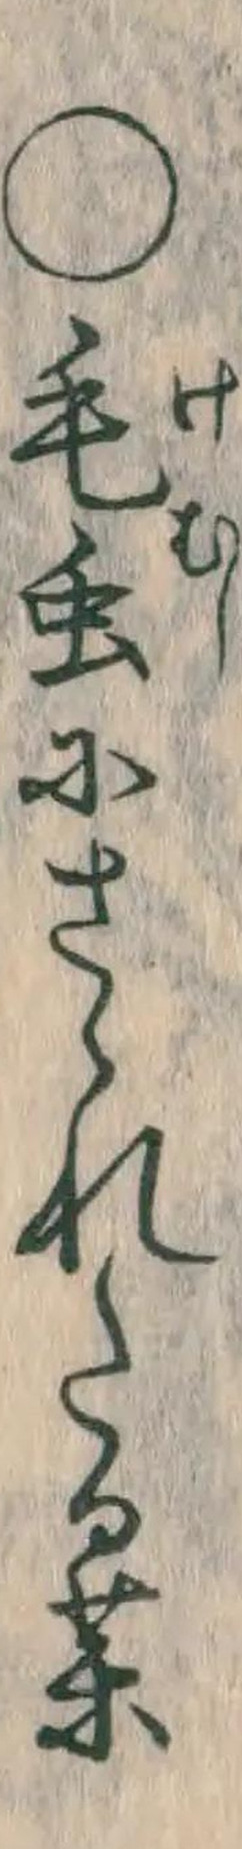○毛虫にさゝれたる薬
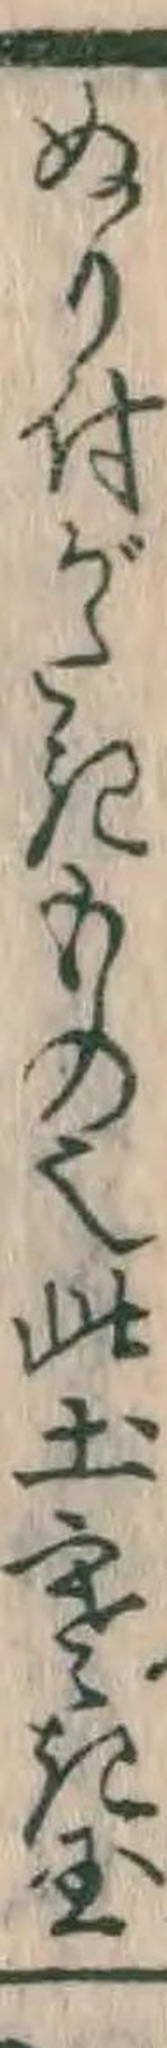ぬり付がたきもの也此土寒き国
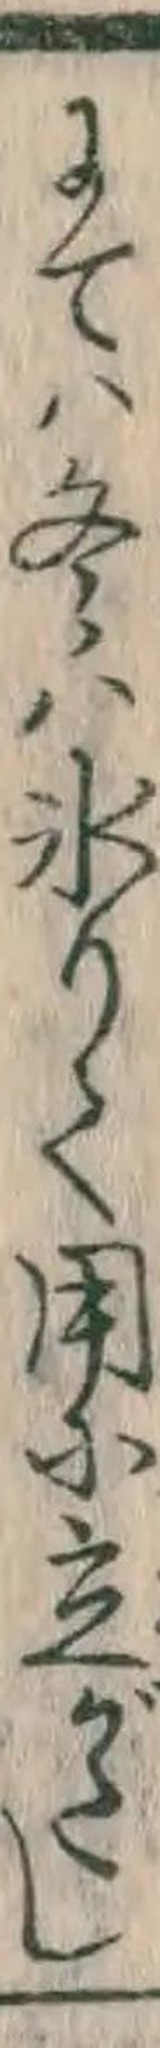にては冬は氷りて用に立がたし
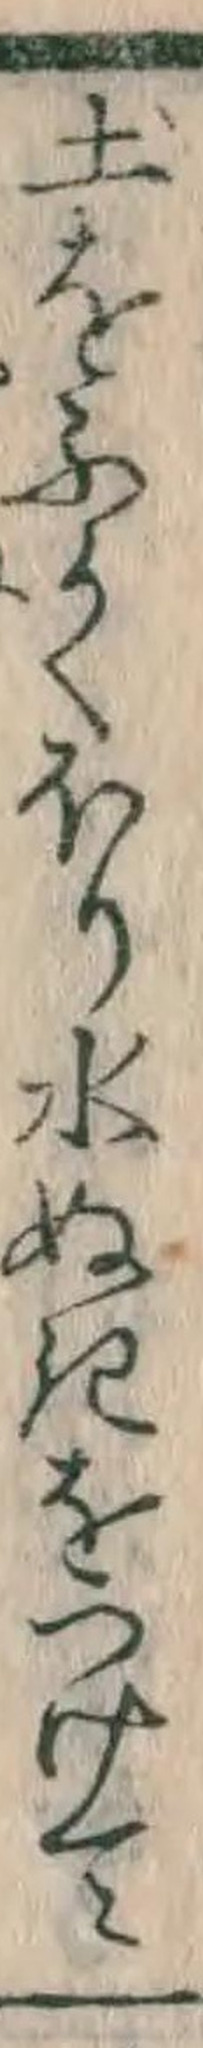土をふかくほり水ぬきをつけて
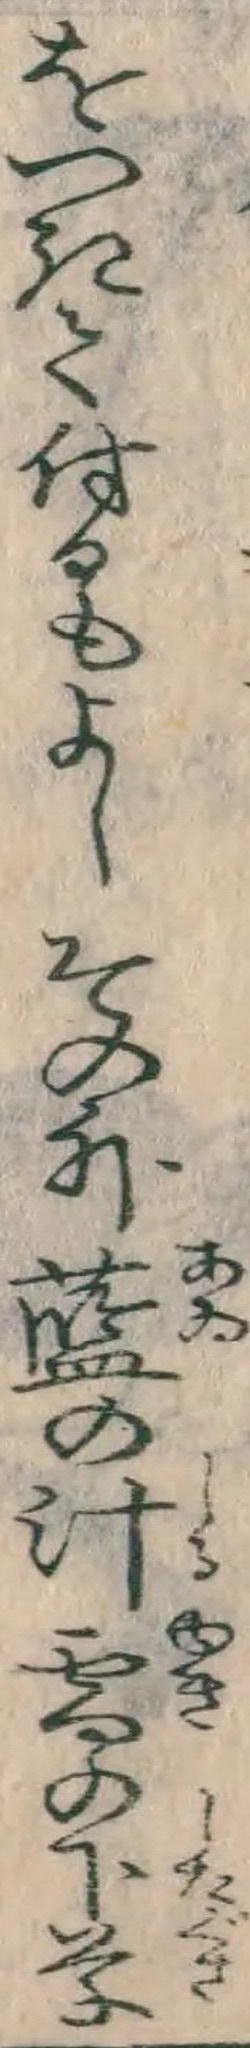をつきて付るもよしその外藍の汁雪の下草
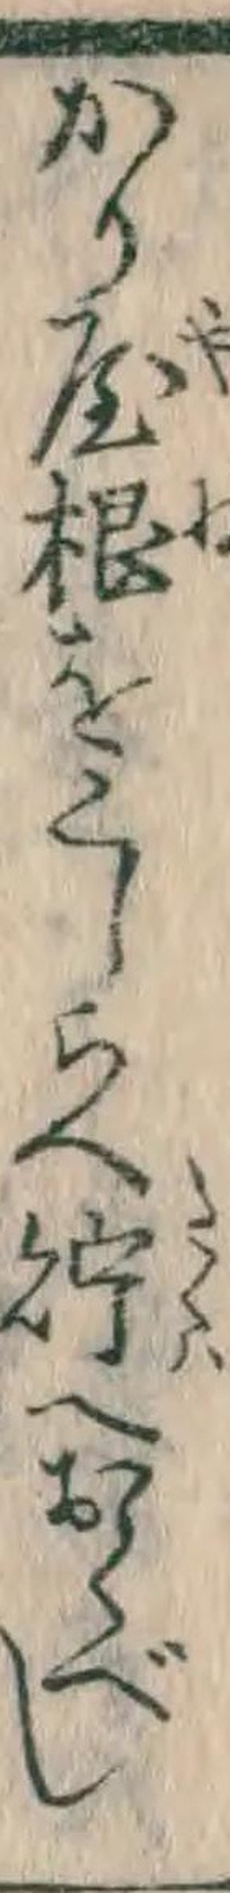かり屋根をこしらへ貯へおくべし
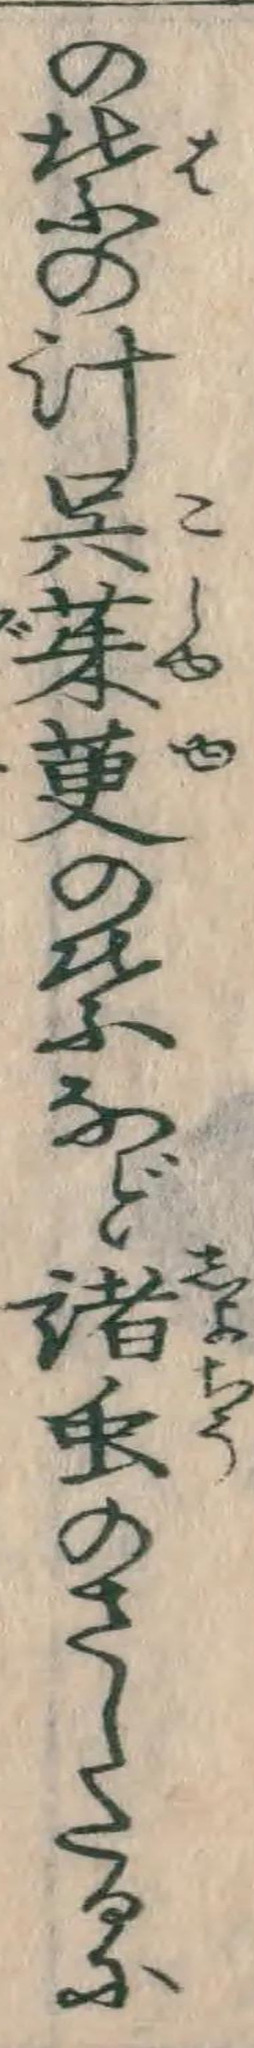の葉の汁呉茱茰の葉など諸虫のさしたるに
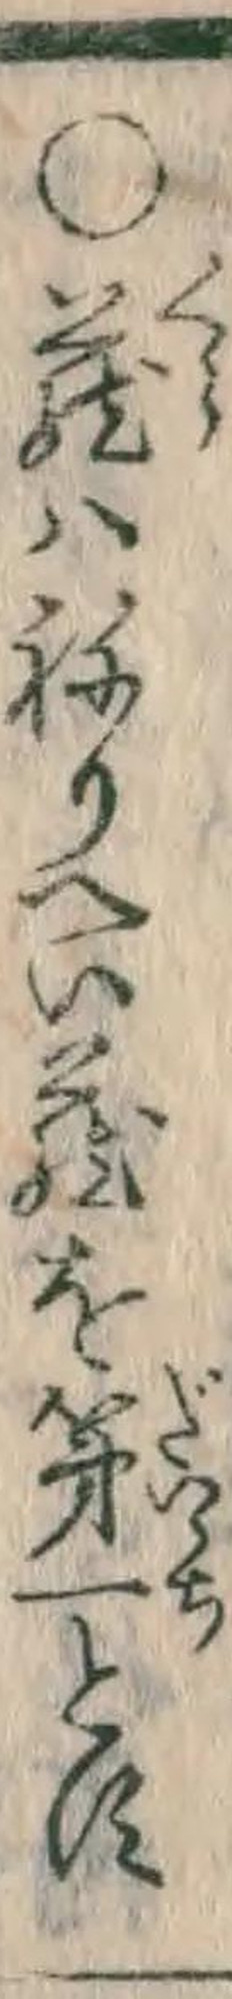○蔵はねりへい蔵を第一とす
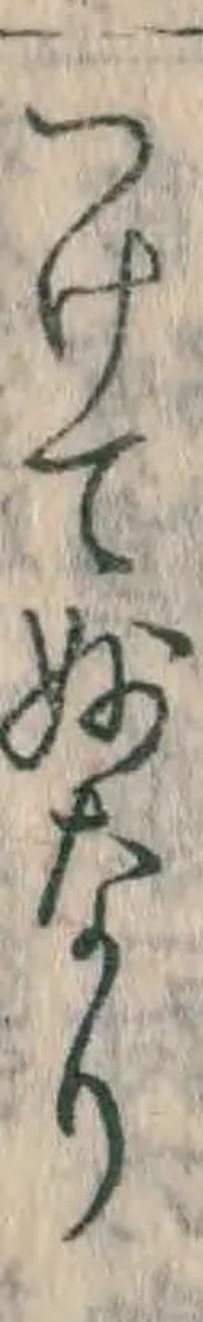つけて妙なり
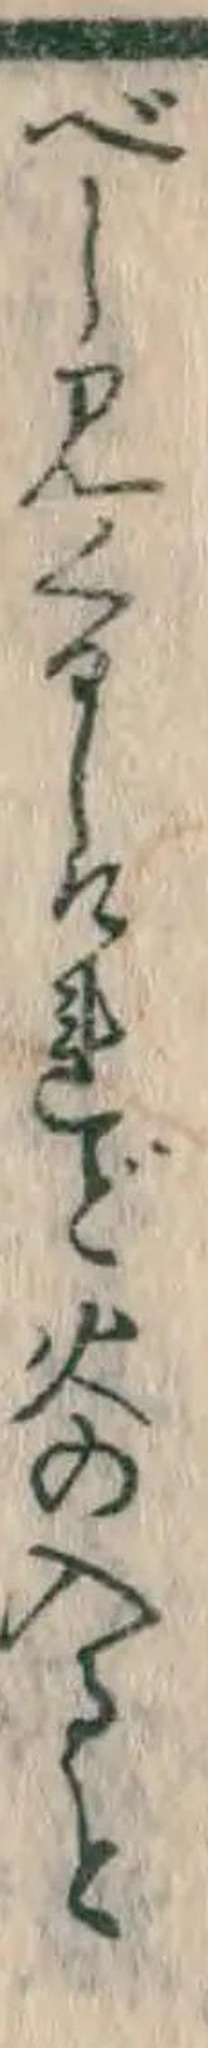べし見くるしけれど火の入ると
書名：広益秘事大全 3巻. [3]
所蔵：国立国会図書館 National Diet Library, JAPAN
